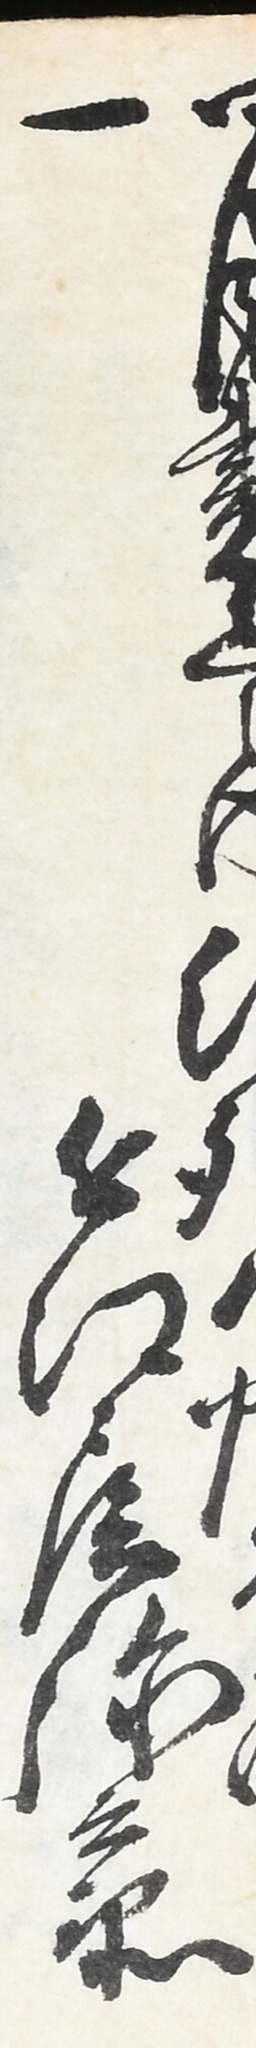一近江屋太兵衛
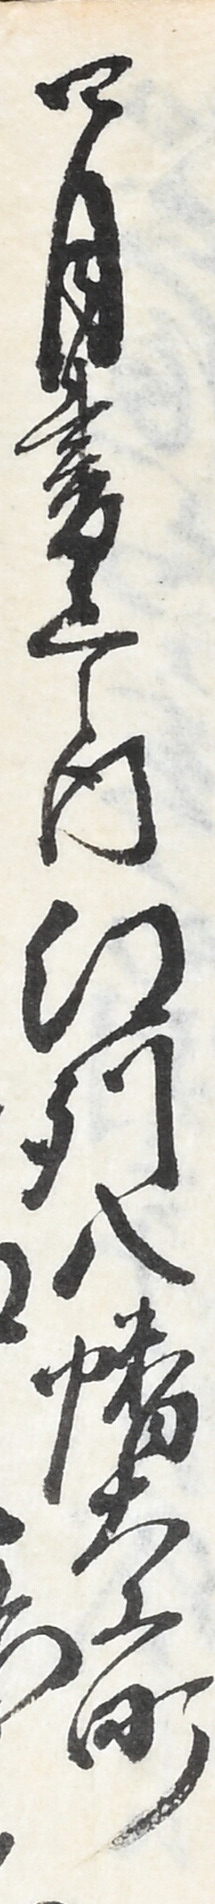四月書上之内江州八幡大工町

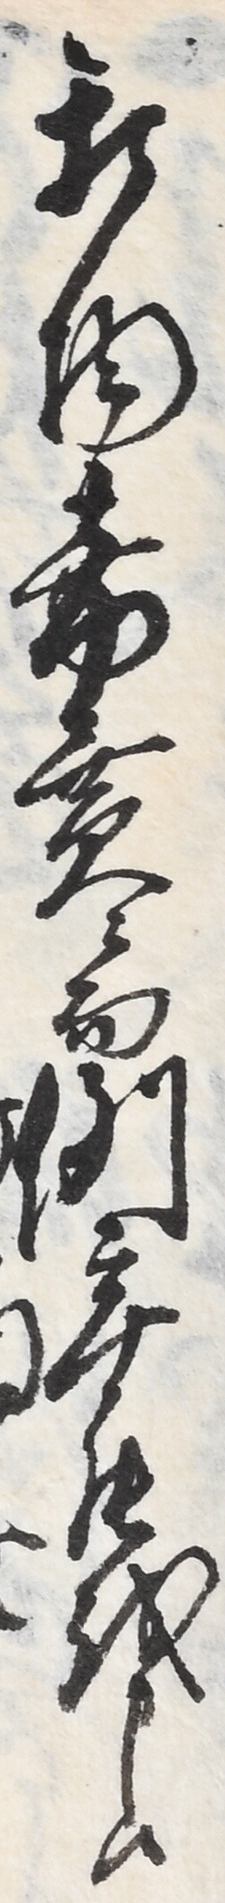小間物商売ニ而例年罷越申候
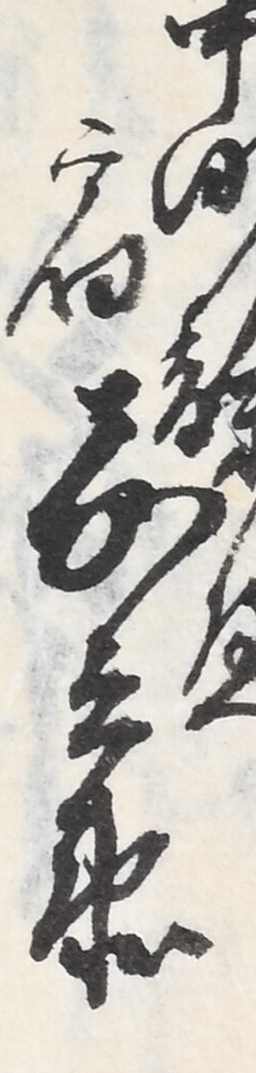宿吉兵衛
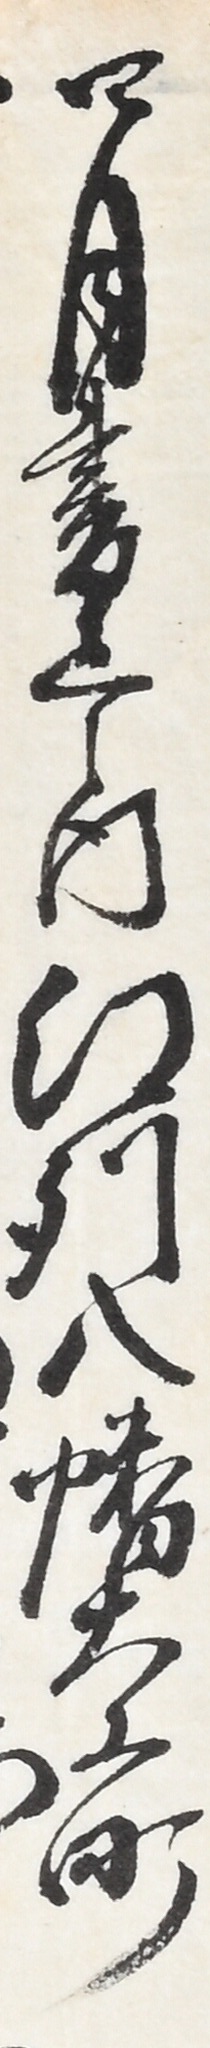四月書上之内江州八幡大工町
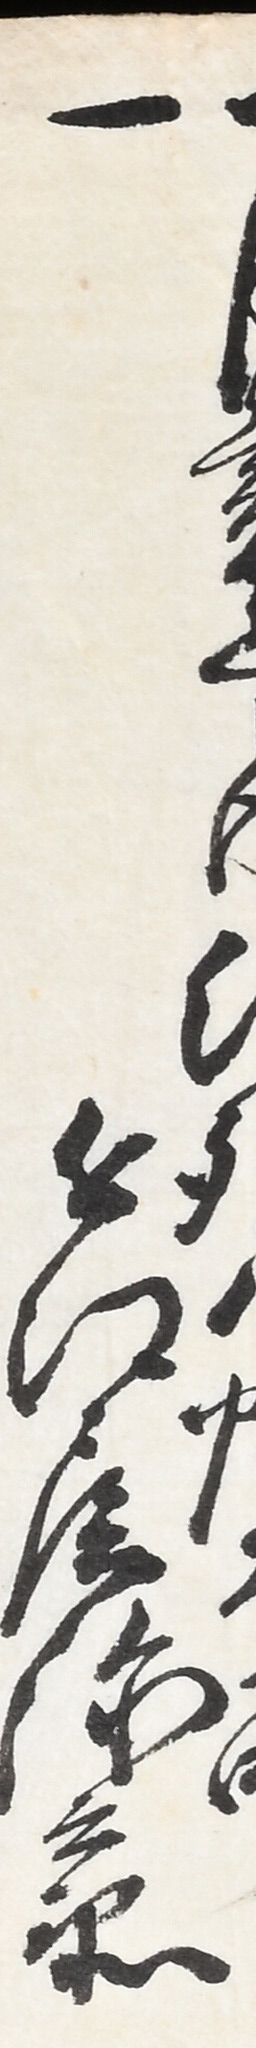一近江屋弥兵衛
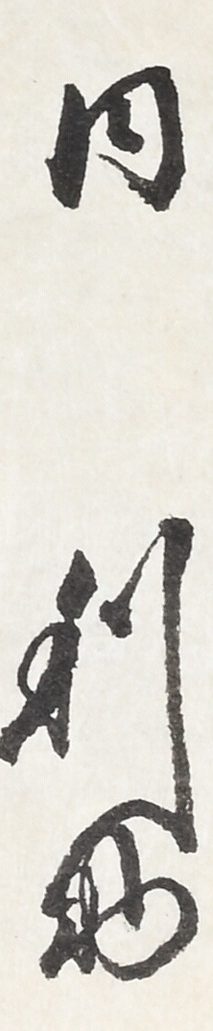同利助
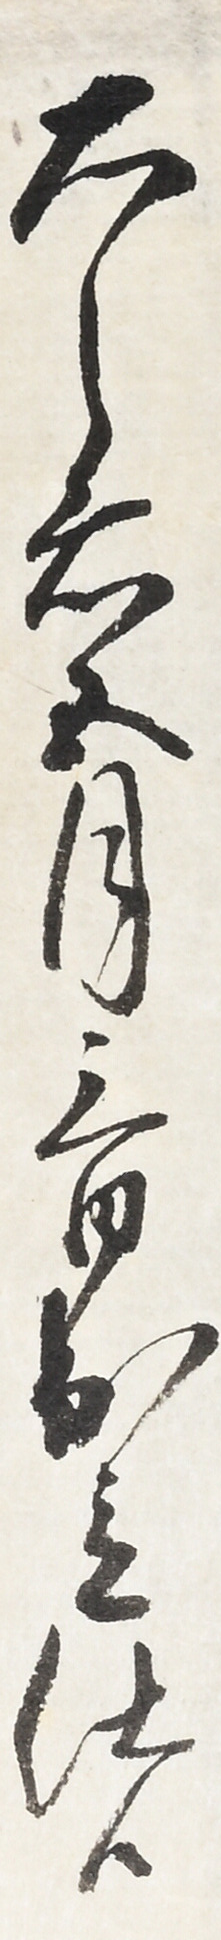右之者五月三日出立仕候
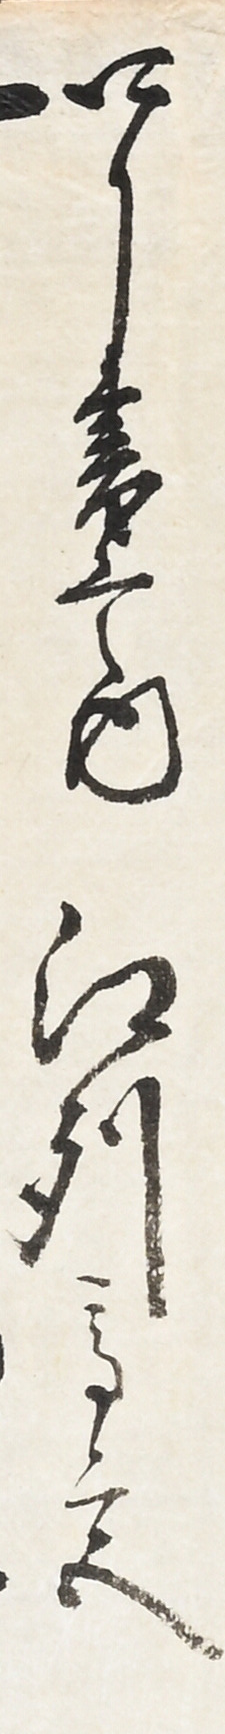四月書上之内江州高宮
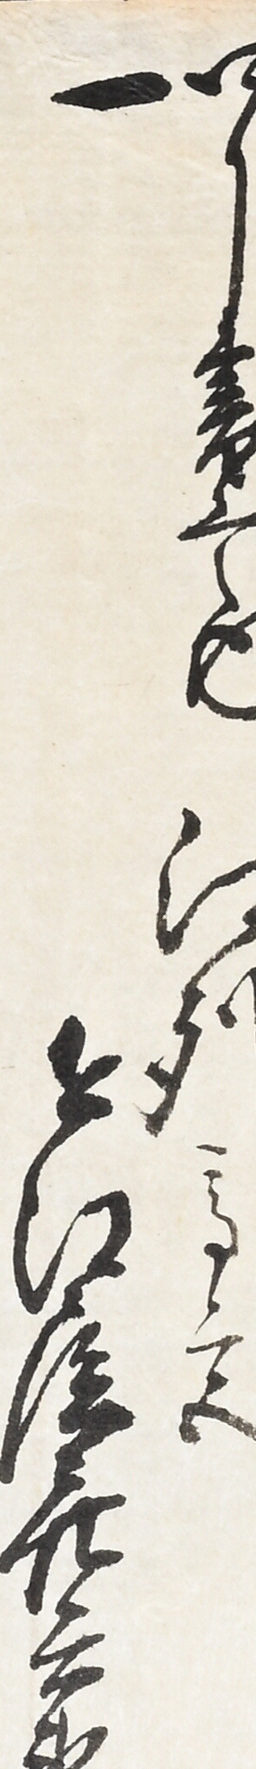一近江屋喜兵衛
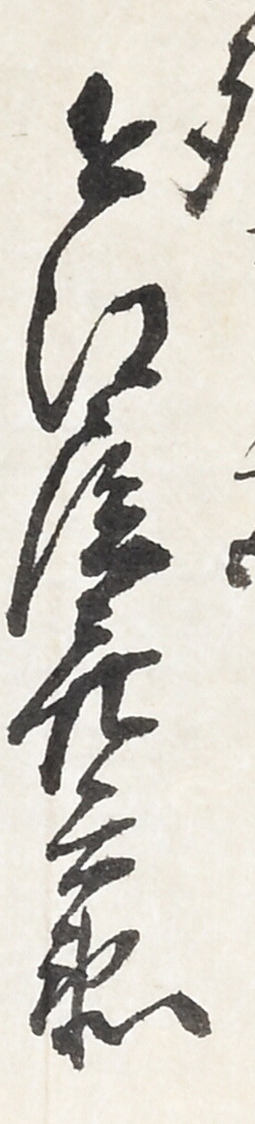一近江屋喜兵衛
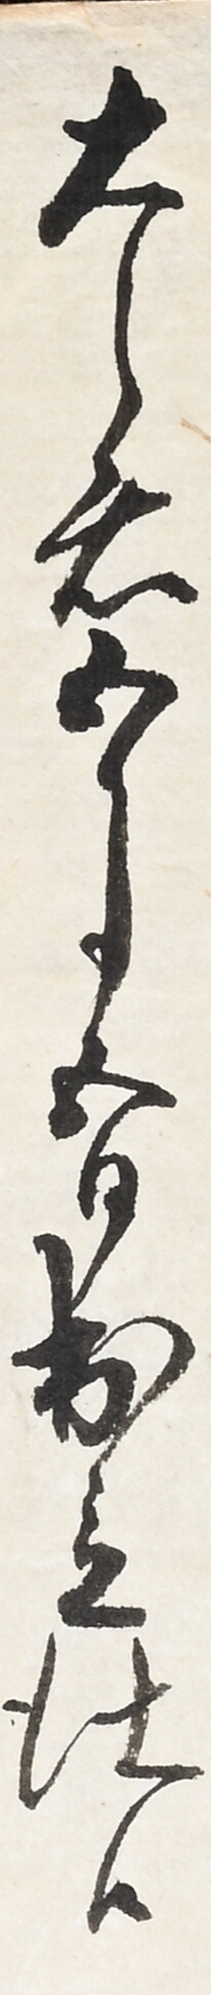右之者五月五日出立仕候
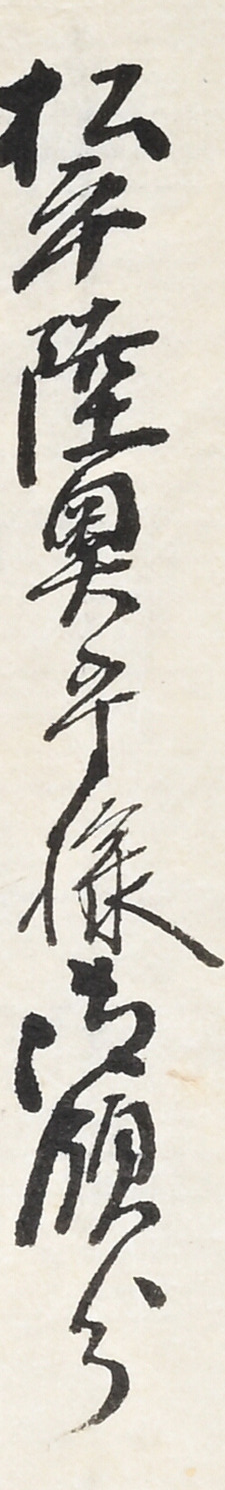松平陸奥守様御領分
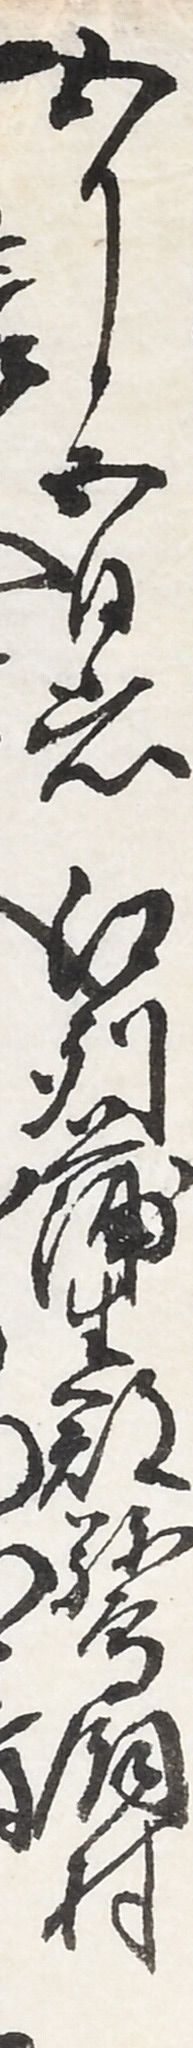五月五日着江州蒲生郡鷹飼村
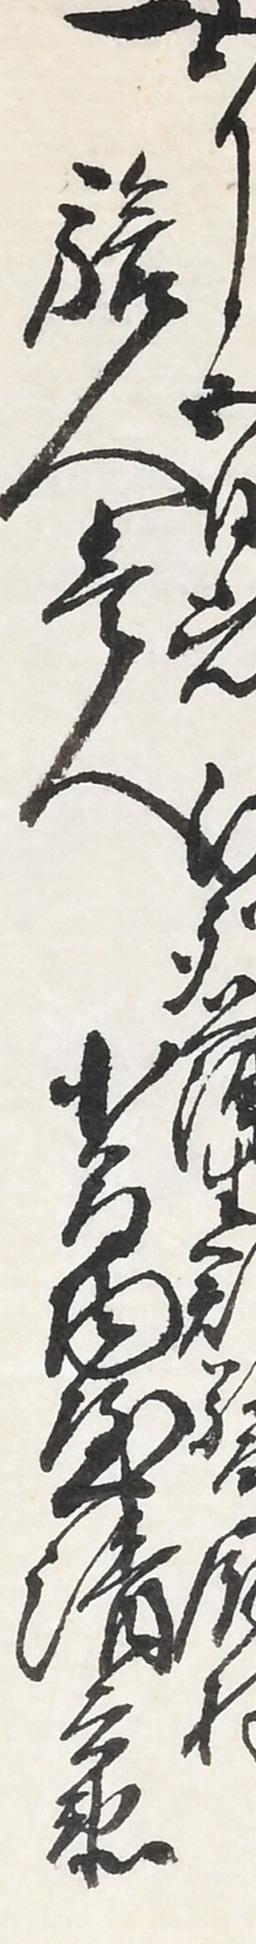一旅人壱人小間物屋清兵衛
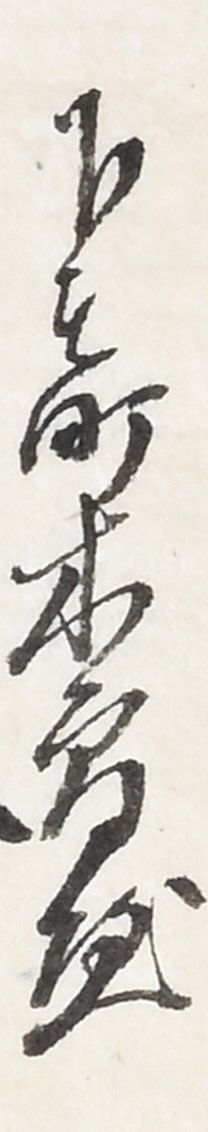下モ町木曽屋
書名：旅人泊控帳
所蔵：伊那市立高遠町図書館・合同会社AMANE
